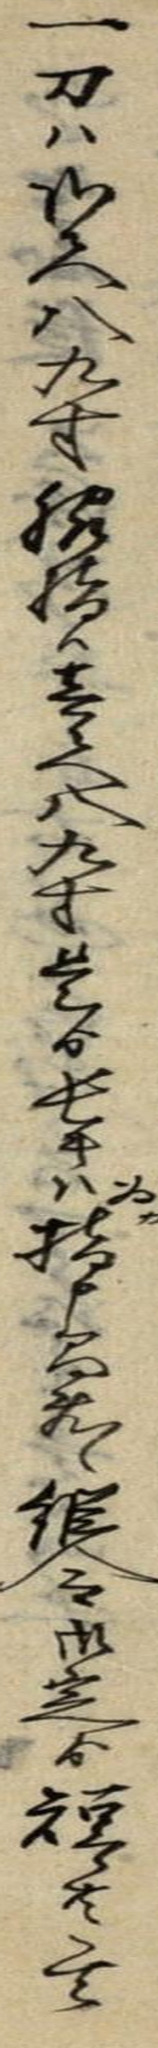一刀は弐尺八九寸脇指は壱尺八九寸是ゟ長きは指申間敷候縦令御定ゟ短候共其
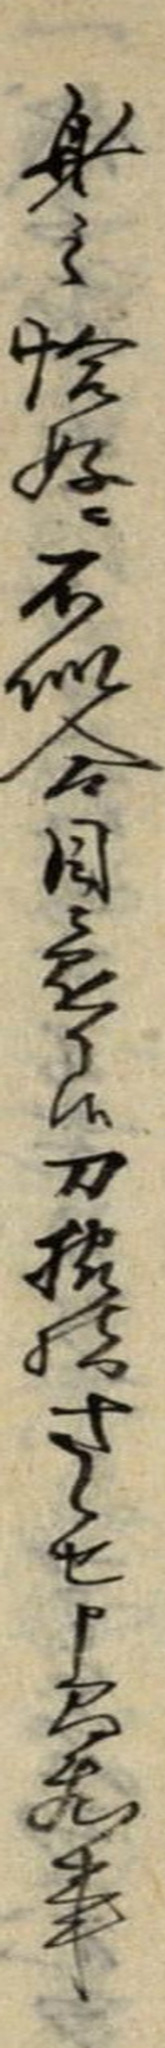身之恰好に不似合目に懸り候刀脇指さゝせ申間敷事
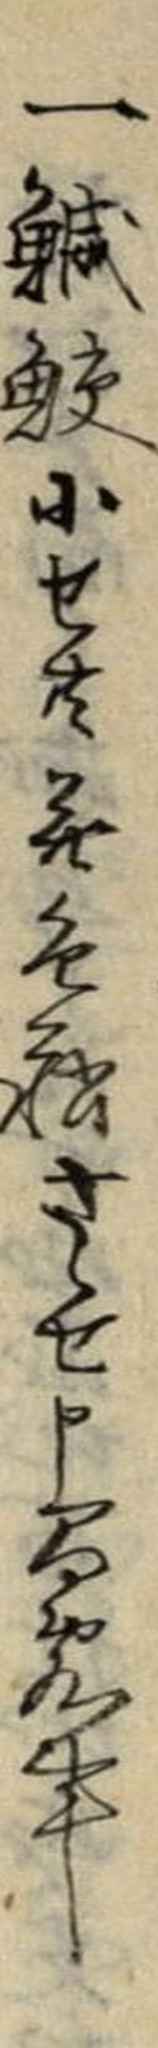一鰔鮫にせ共幷色鞘さゝせ申間敷事
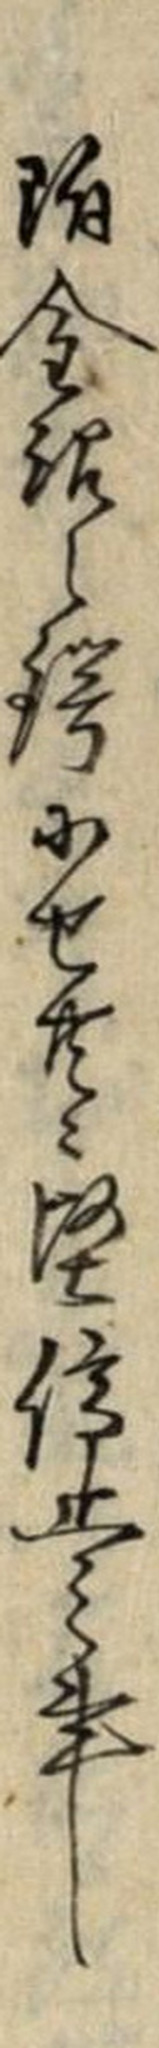附金銀之鍔にせ共に堅停止之事
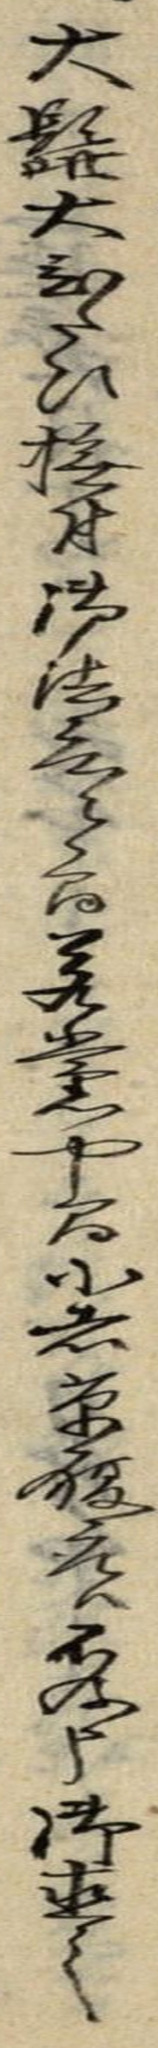一大髭大ひたひ撫付御法度に候間若党中間小者草履取は不及申御直之
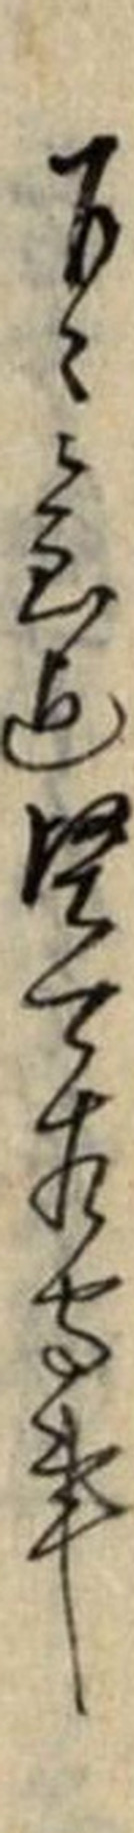下々に至迄堅可相守事
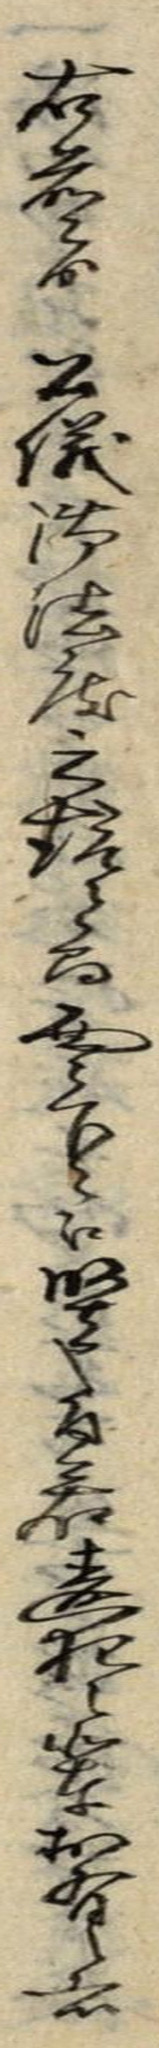右前々ゟ公儀御法度之趣に候間面々下々え堅申付若違犯之輩於有之は
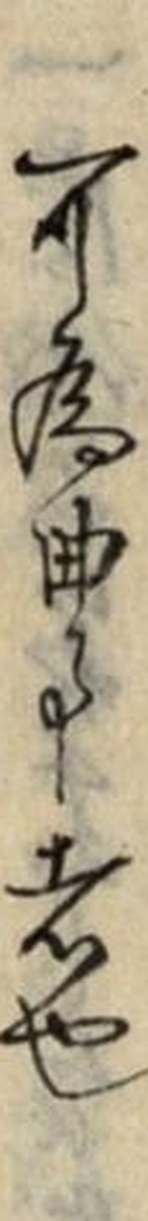可為曲事者也
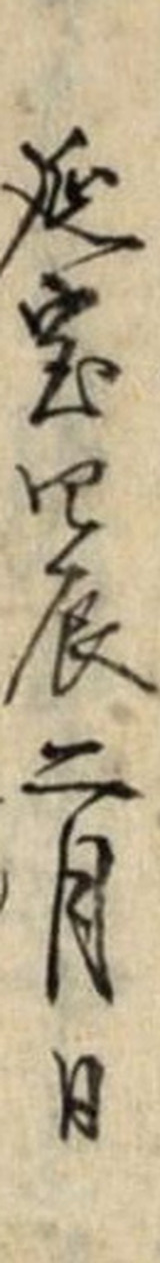延宝四辰二月日
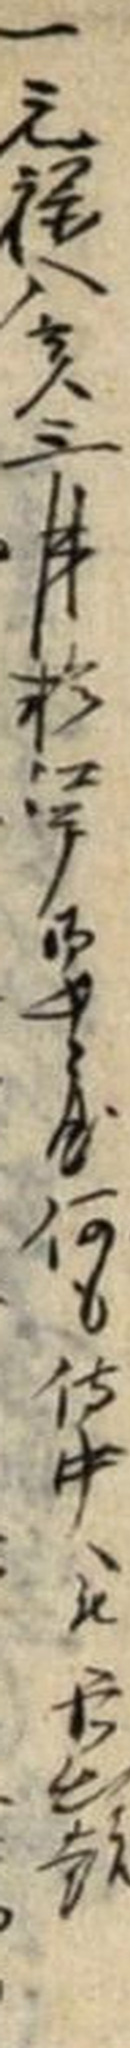一元禄八亥三月於江戸御長屋何も侍中へ被仰出趣
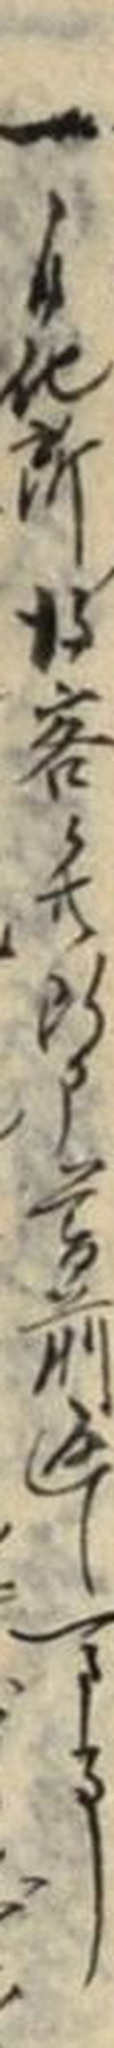一自他所得客候共断申暮前返し可申事
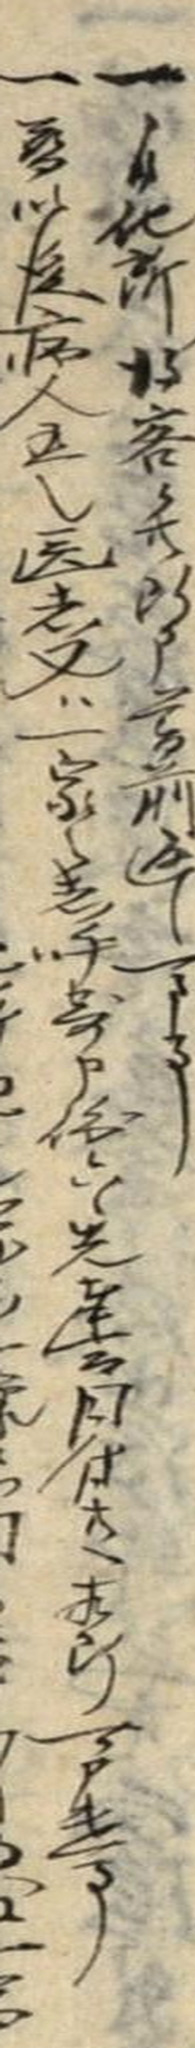一暮以後病人有之医者又は一家之者呼寄申儀候はゝ先達て目付共へ相断可申遣事

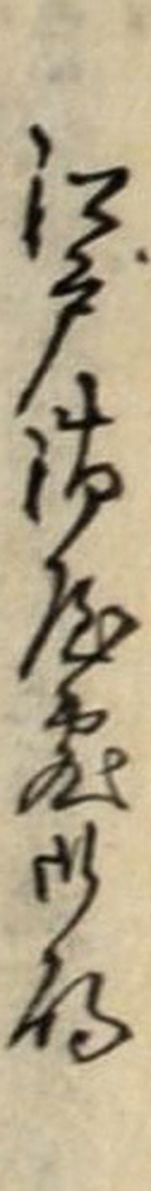江戸御屋敷御触
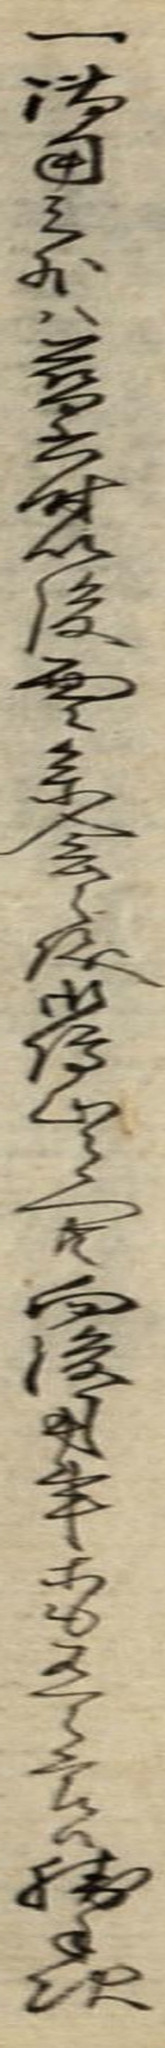一御用之外は暮六時以後面々参会之儀御停止に候へ共向後用事等も有之候節は勝手次
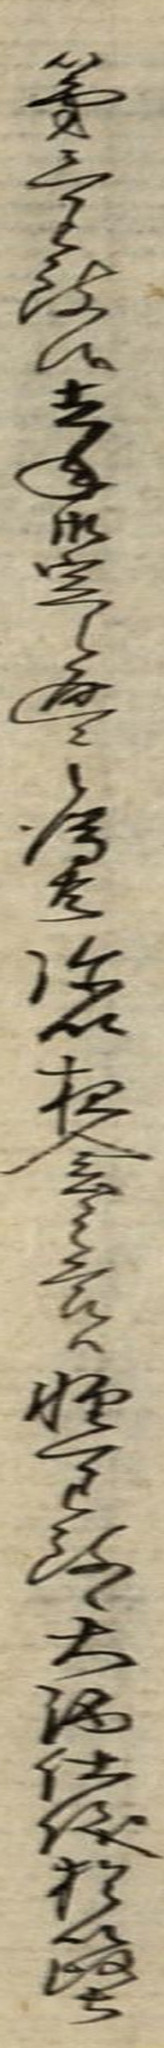第に可被致候去年御定之通に候得共弥以夜会之節は軽可被致候大酒仕儀猶以堅
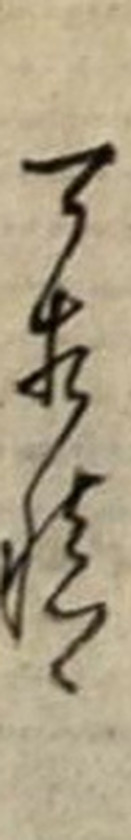可相慎候
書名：三都并道中之部
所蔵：福井県文書館 Fukui Prefectural Archives
